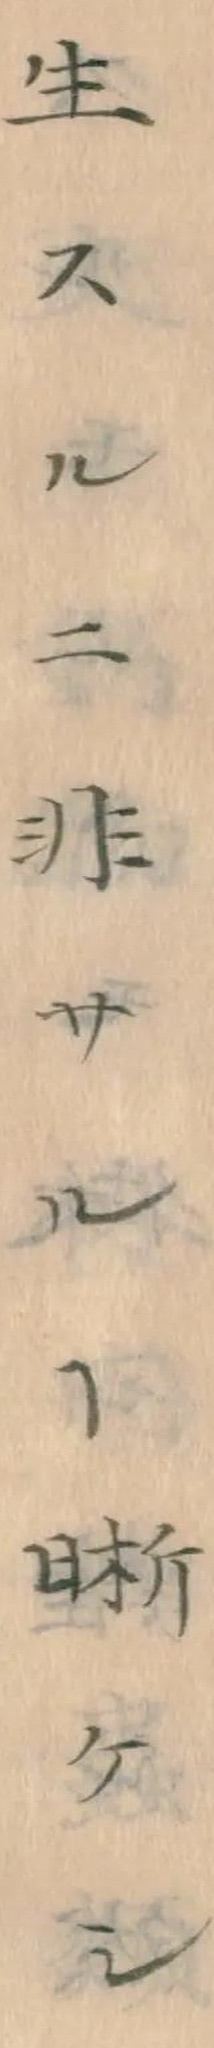生スルニ非サルコト晰ケシ
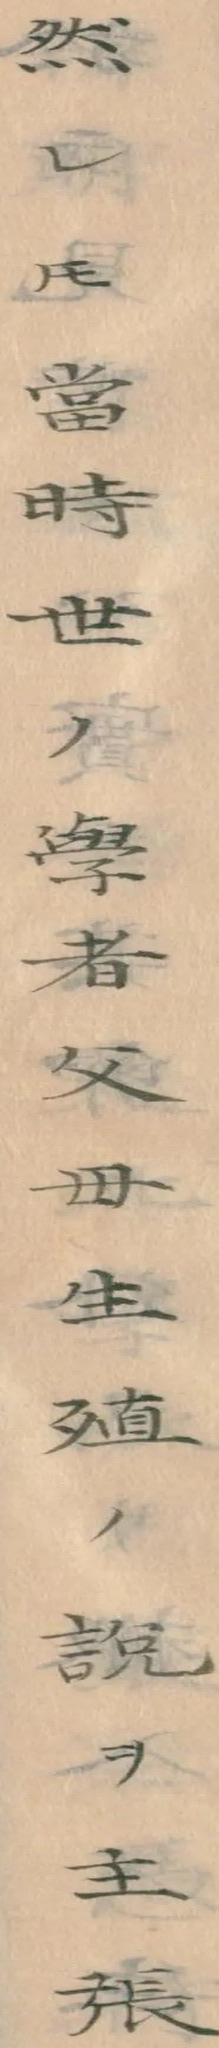然レトモ当時世ノ学者父母生殖ノ説ヲ主張
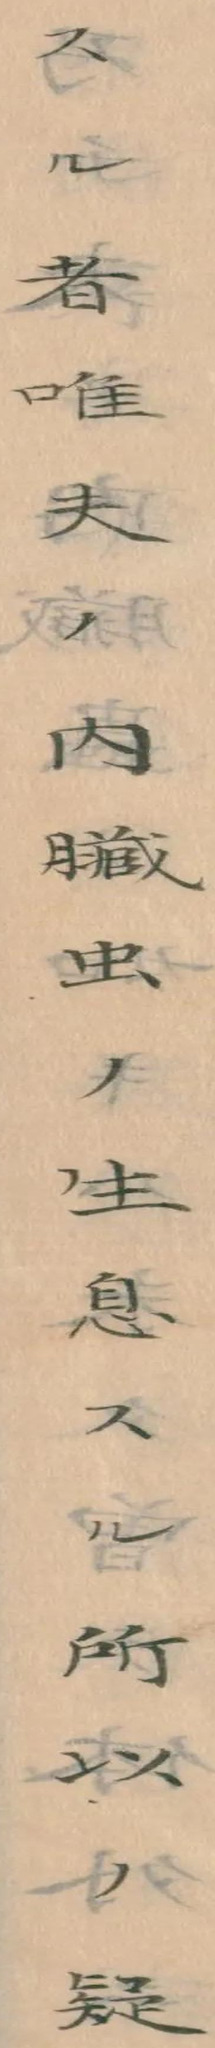スル者唯夫ノ内臓虫ノ生息スル所以ノ疑
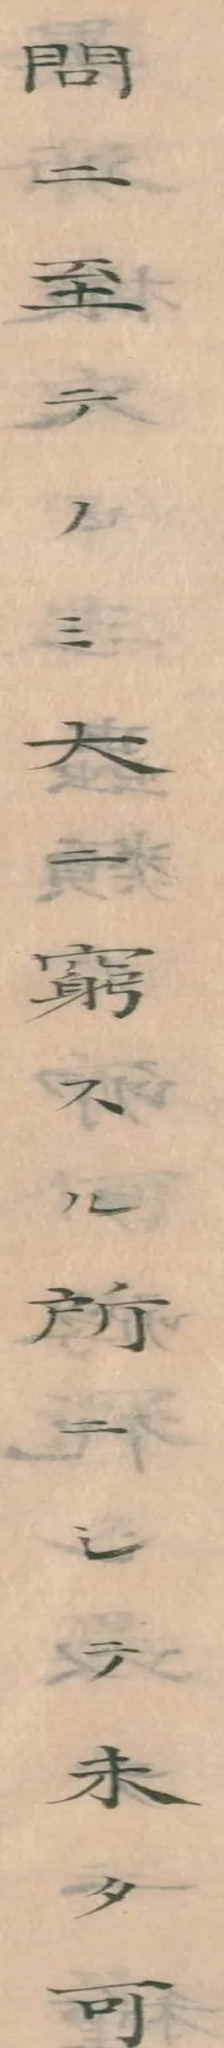問ニ至テノミ大ニ窮スル所ニシテ未タ可
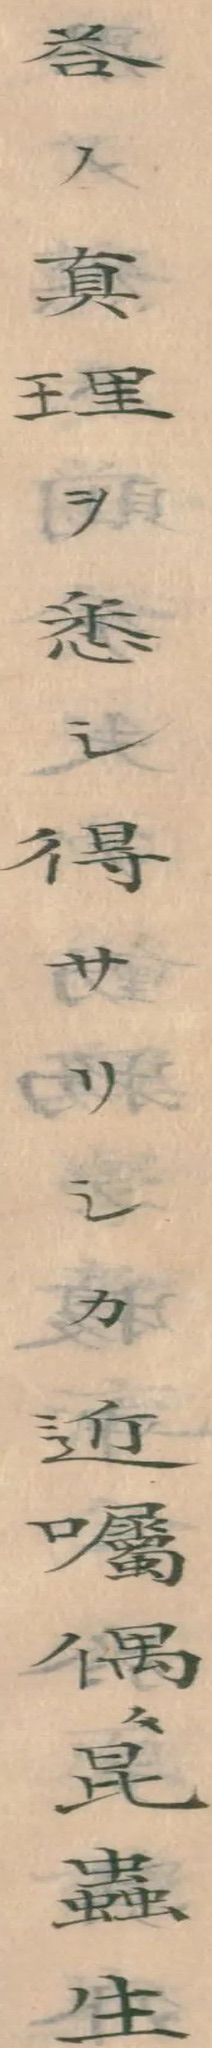答ノ真理ヲ悉シ得サリシカ近嘱偶々昆虫生
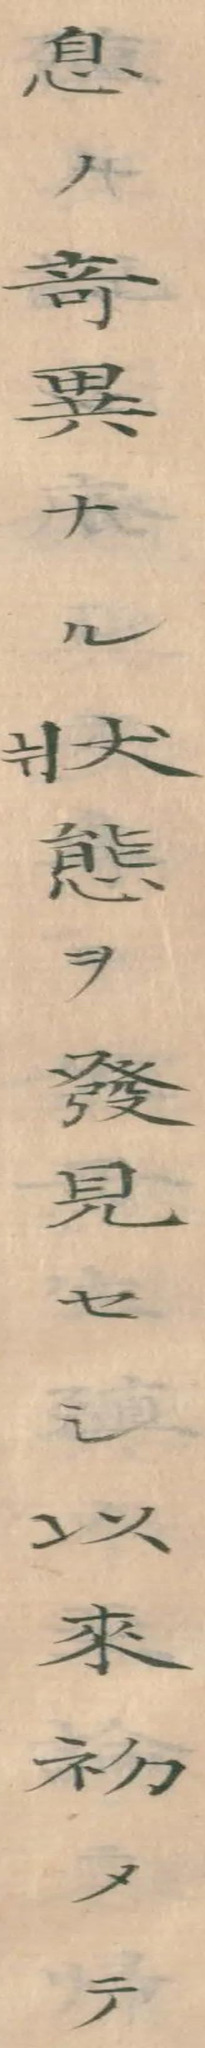息ノ奇異ナル状態ヲ発見セシ以来初メテ
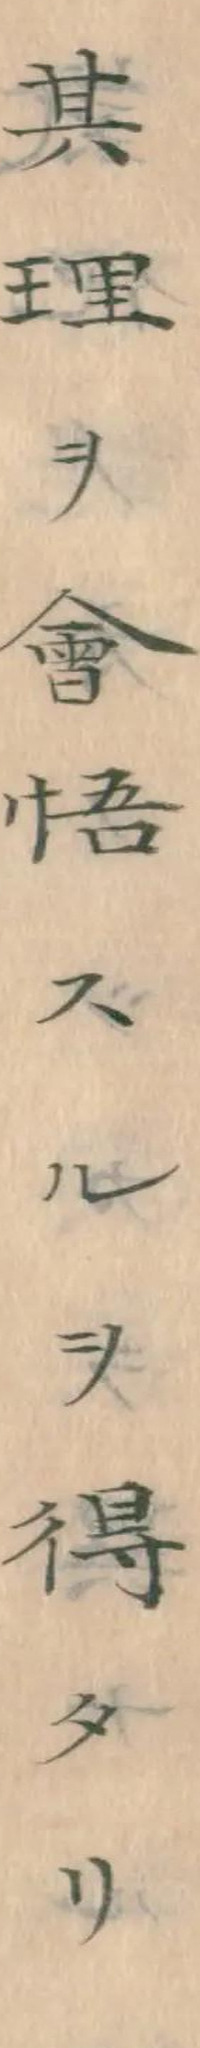其理ヲ会悟スルヲ得タリ
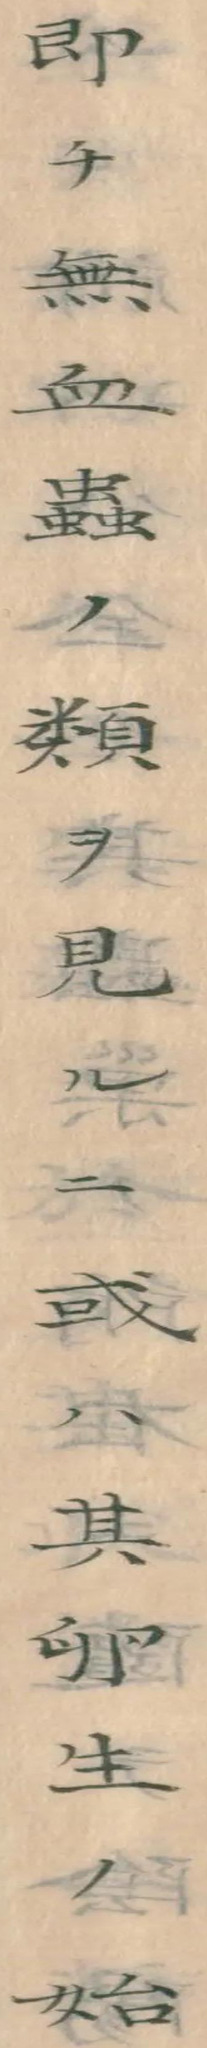即チ無血虫ノ類ヲ見ルニ或ハ其卵生ノ始
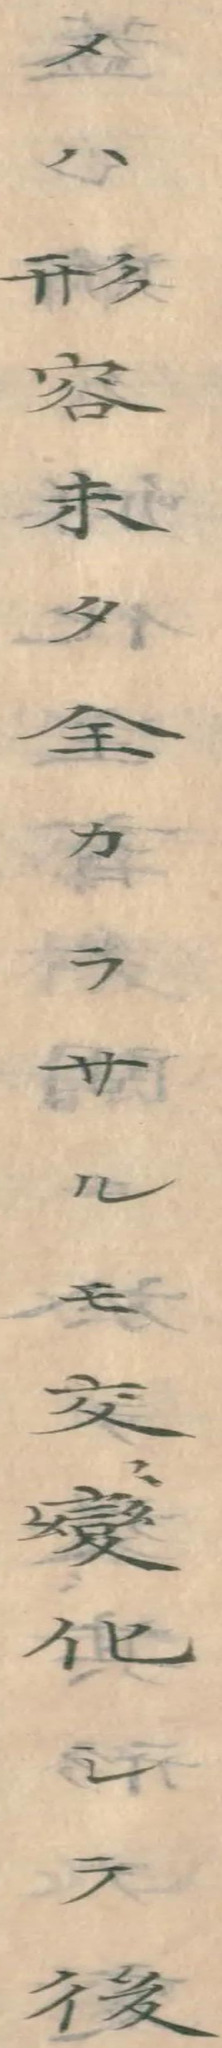メハ形容未タ全カラサルモ交々変化シテ後
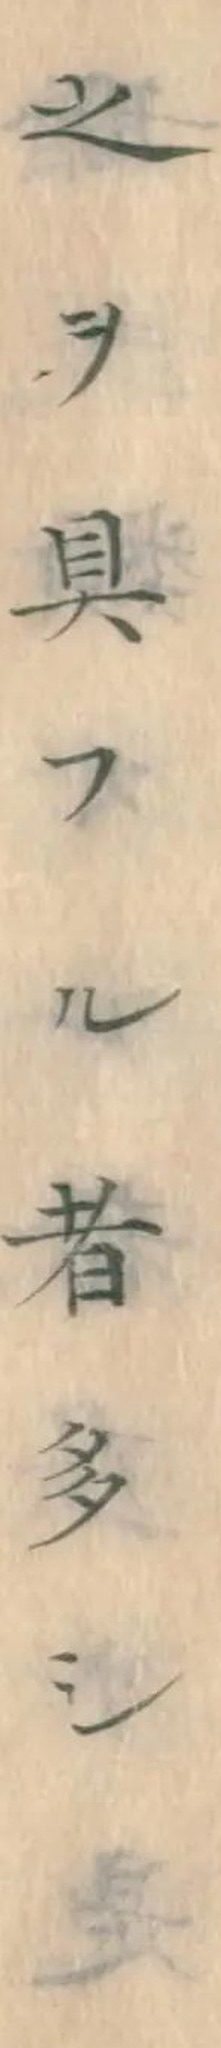之ヲ具フル者多シ
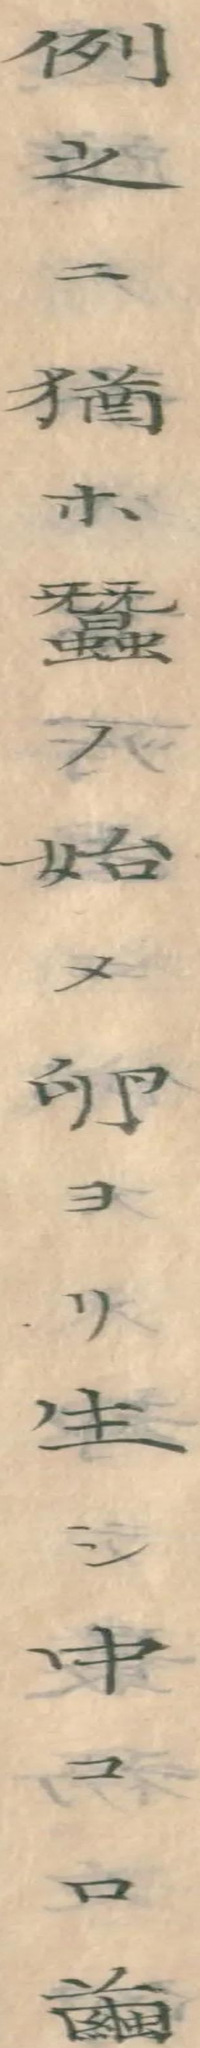例之ニ猶ホ蚕ノ始メ卵ヨリ生シ中コロ繭
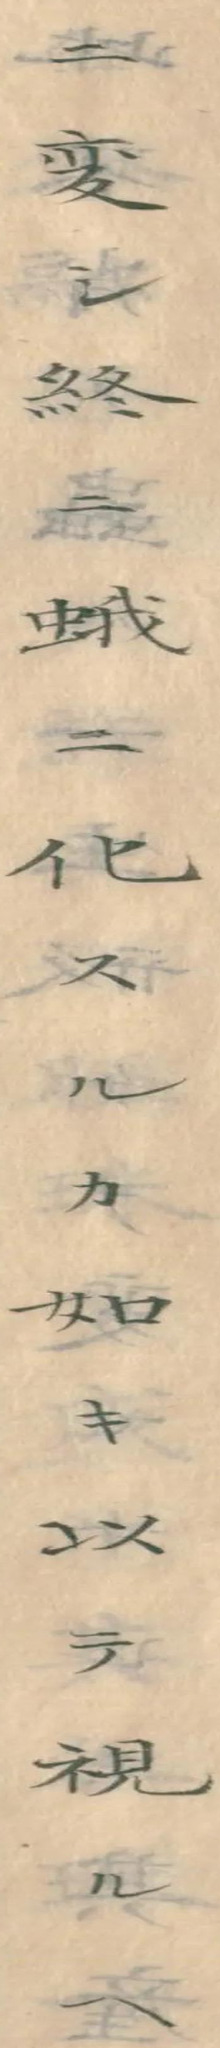ニ変シ終ニ蛾ニ化スルカ如キ以テ視ルヘ
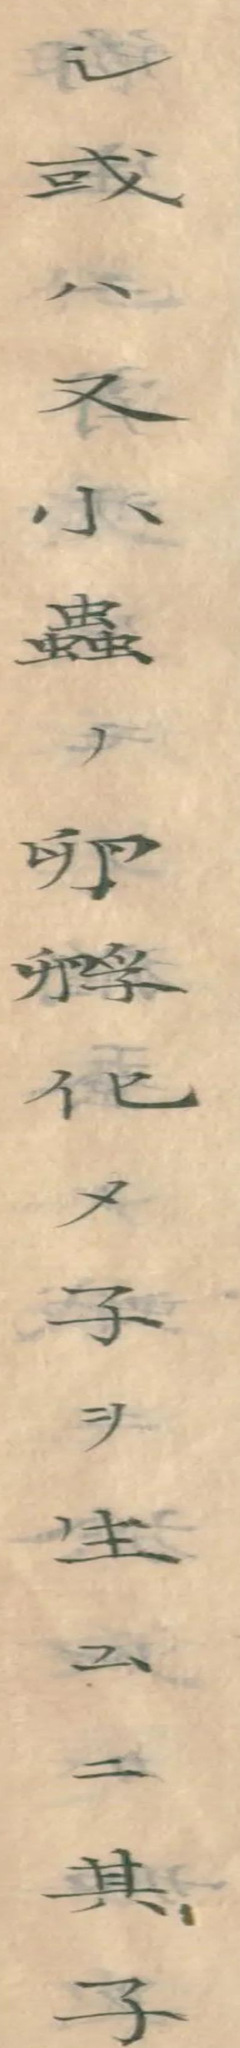シ或ハ又小虫ノ卵孵化シテ子ヲ生ムニ其子

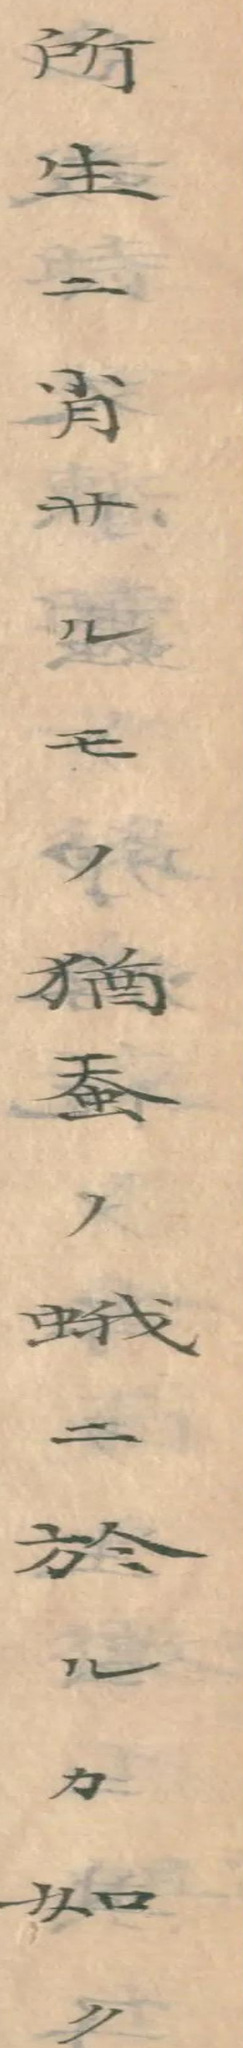所生ニ肖サルモノ猶蚕ノ蛾ニ於ルカ如ク
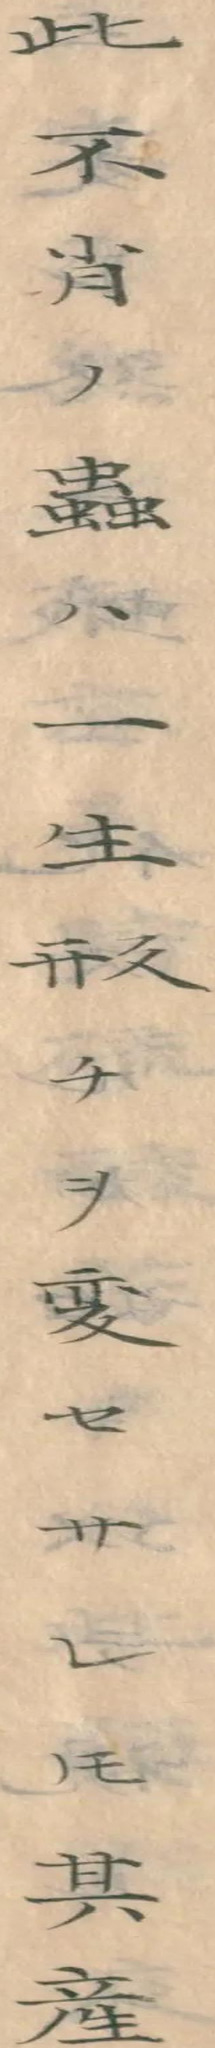此不肖ノ虫ハ一生形チヲ変セサレトモ其産
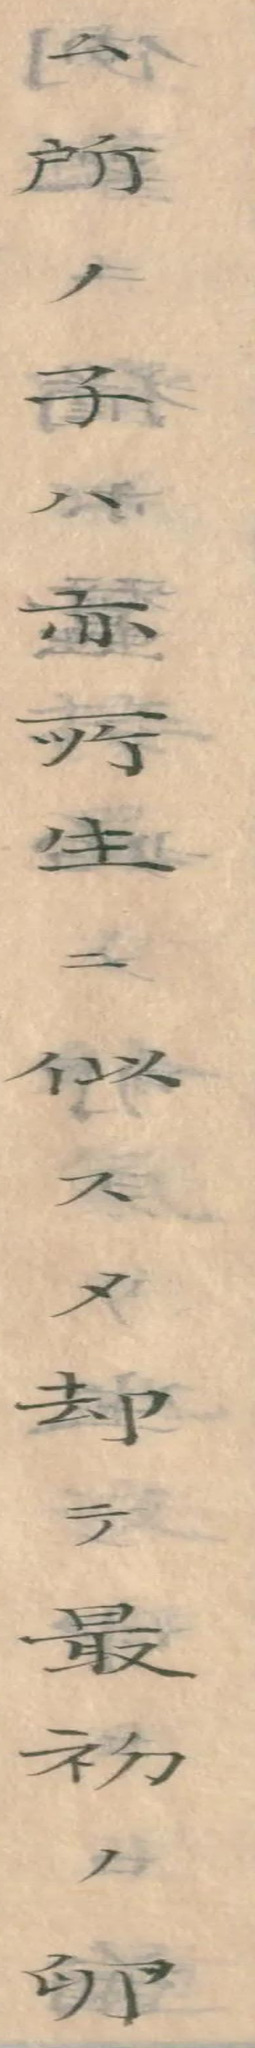ム所ノ子ハ亦所生ニ似スシテ却テ最初ノ卵
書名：蚕桑集成
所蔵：国立国会図書館 National Diet Library, JAPAN
